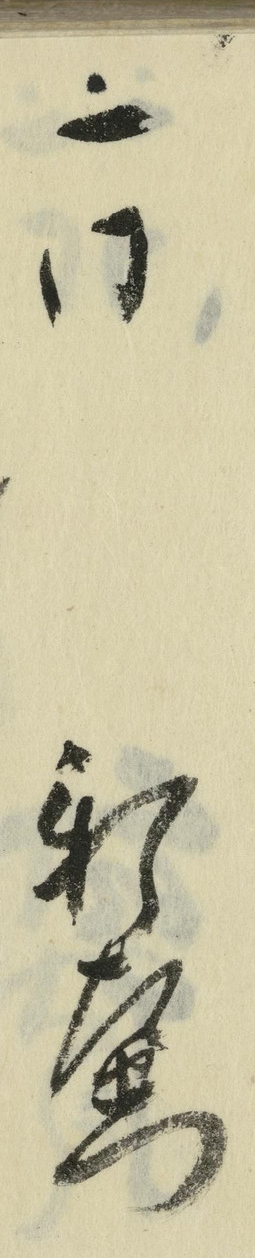一同新左衛門
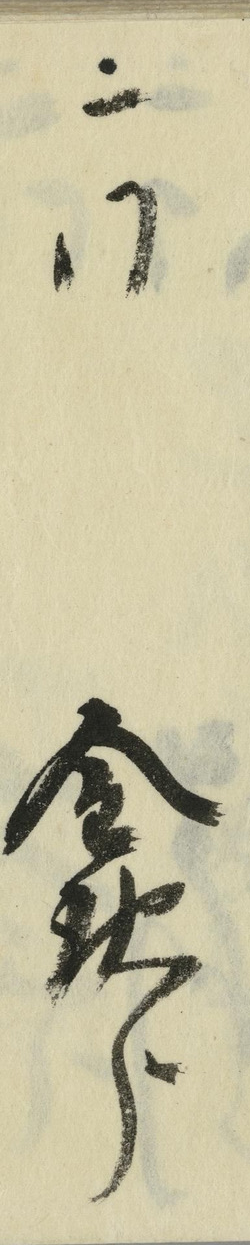一同金次郎

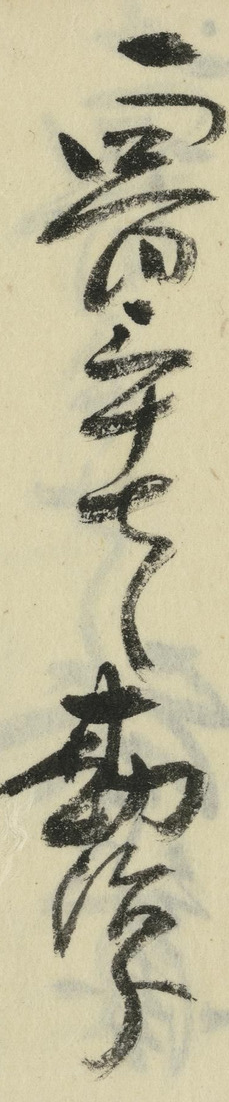一四百三十七文勘治郎
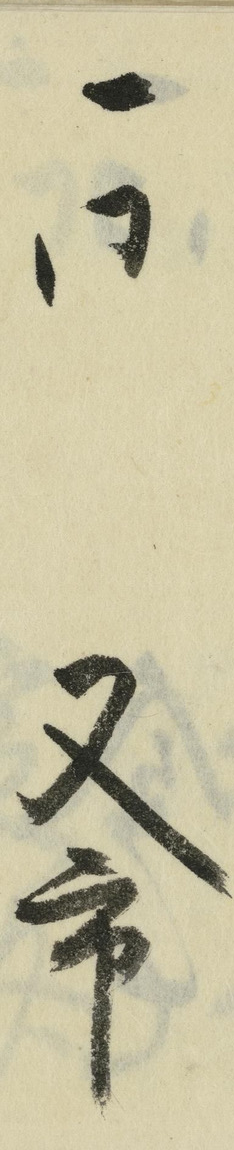一同又市
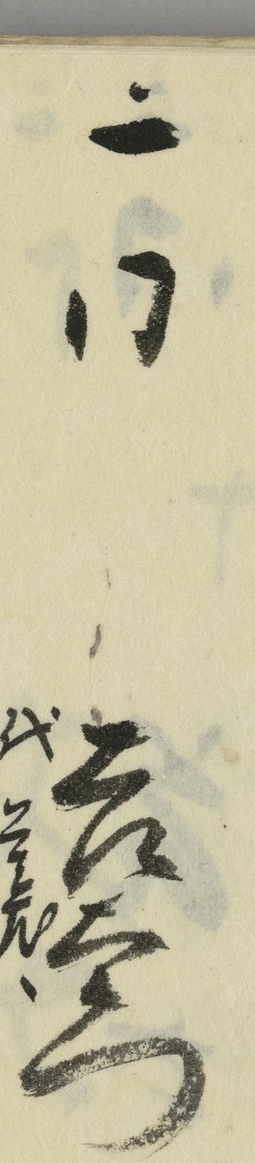一同吉右衛門
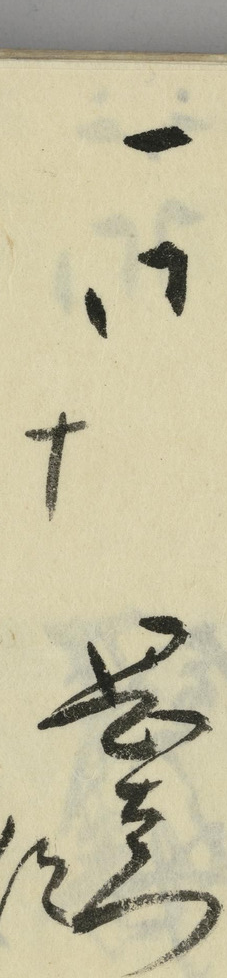一同吉右衛門

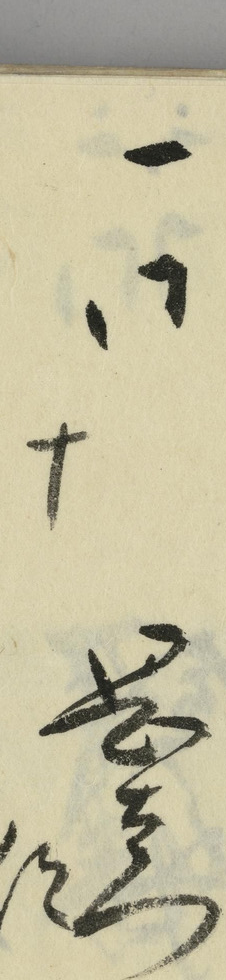一同定右衛門
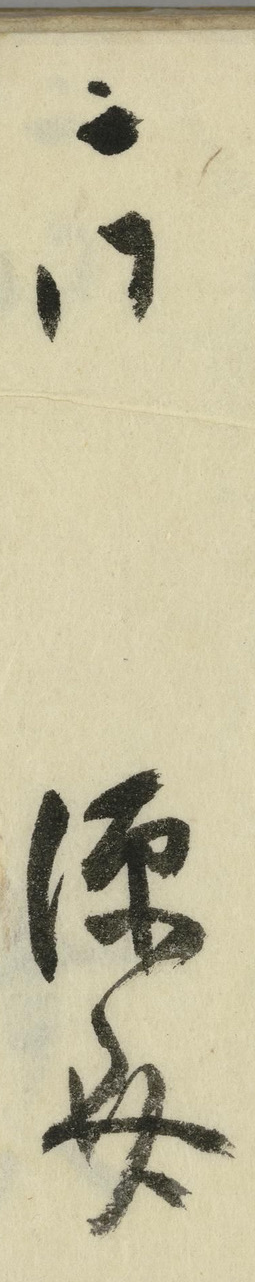一同源太
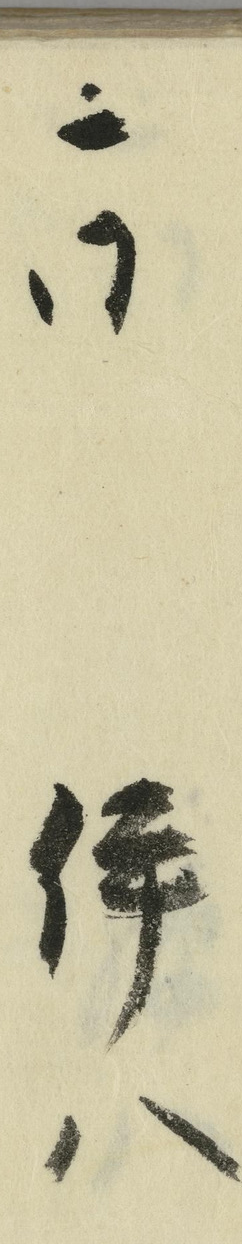一同伊八
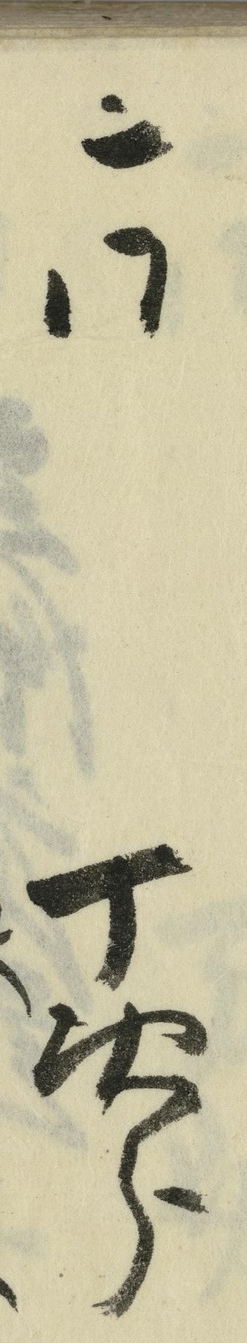一同十次郎
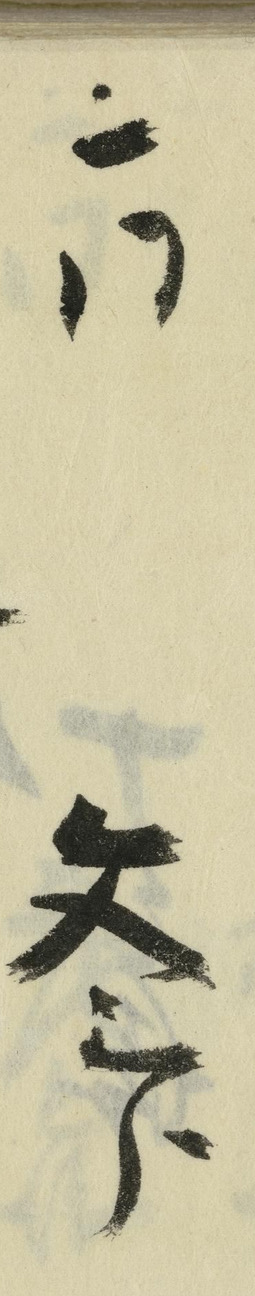一同文三郎
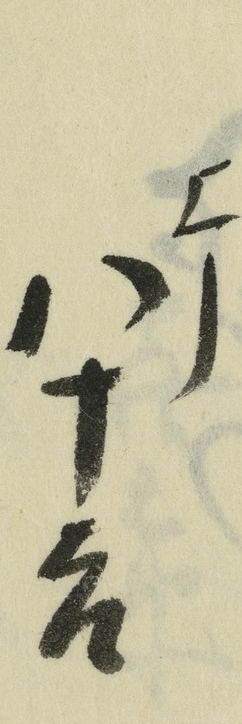八十吉
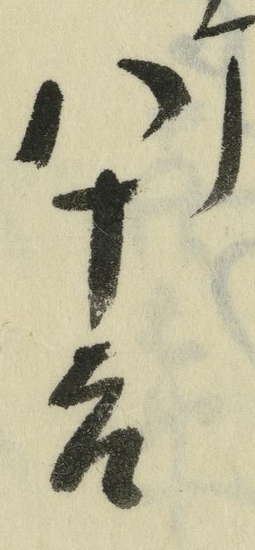八十吉
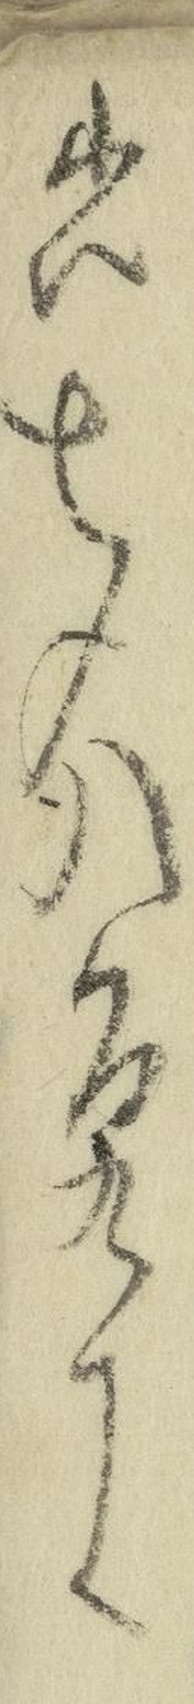小以七貫八百九十文

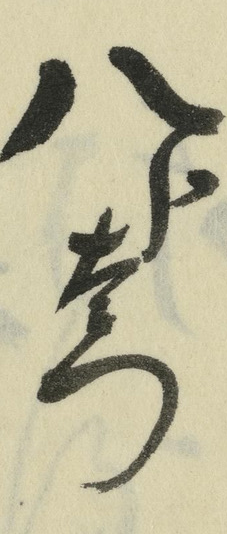八郎右衛門
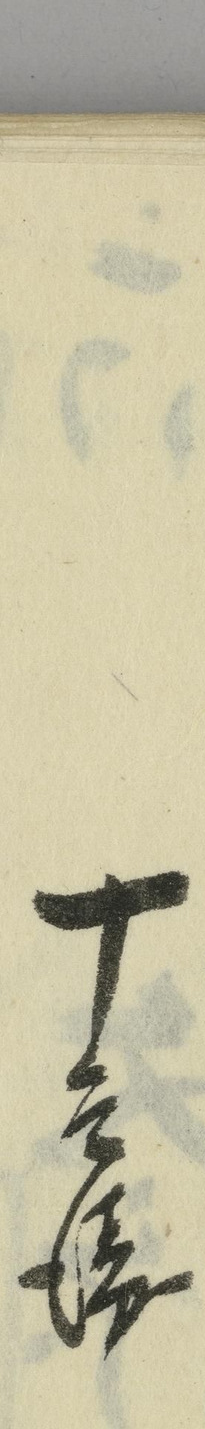十兵衛
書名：天明淺間噴火ニ関スル書類
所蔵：東京大学地震研究所図書室 Earthquake Research Institute Library, The University of Tokyo, JAPAN
